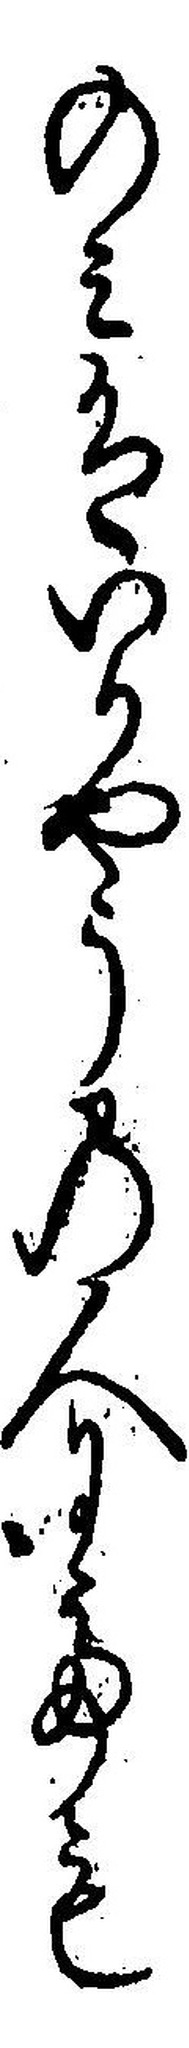のみはいかやうの人にても
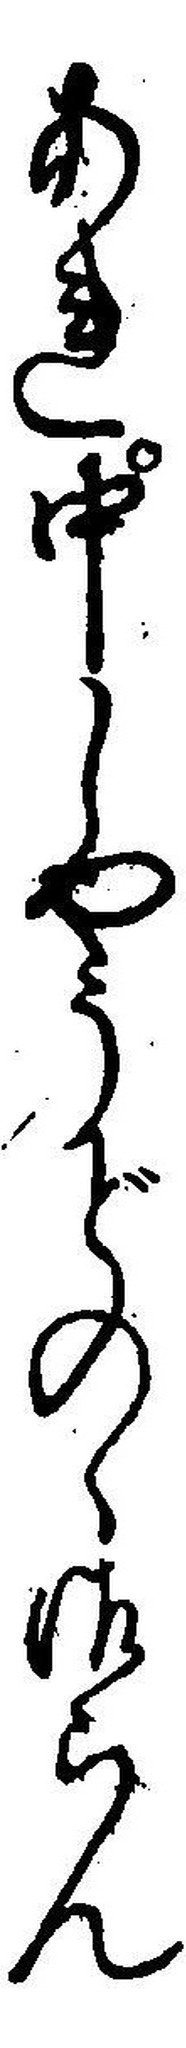あれ。中しやうどのゝ御らん
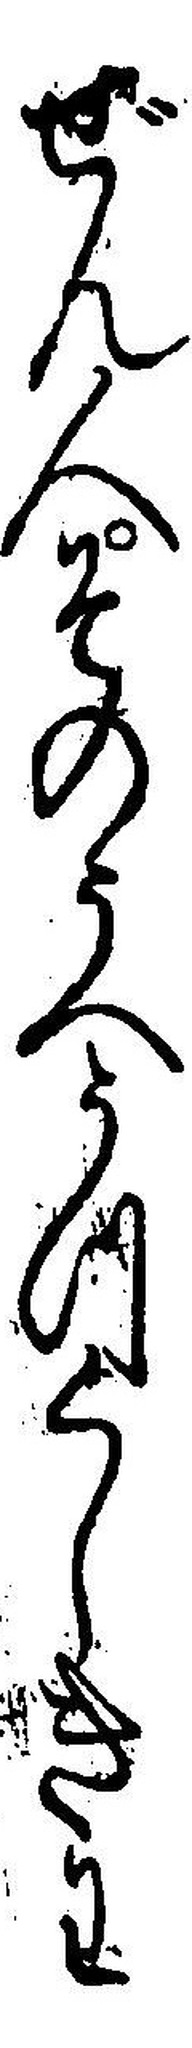ぜん人。そのうへうつくしきわ
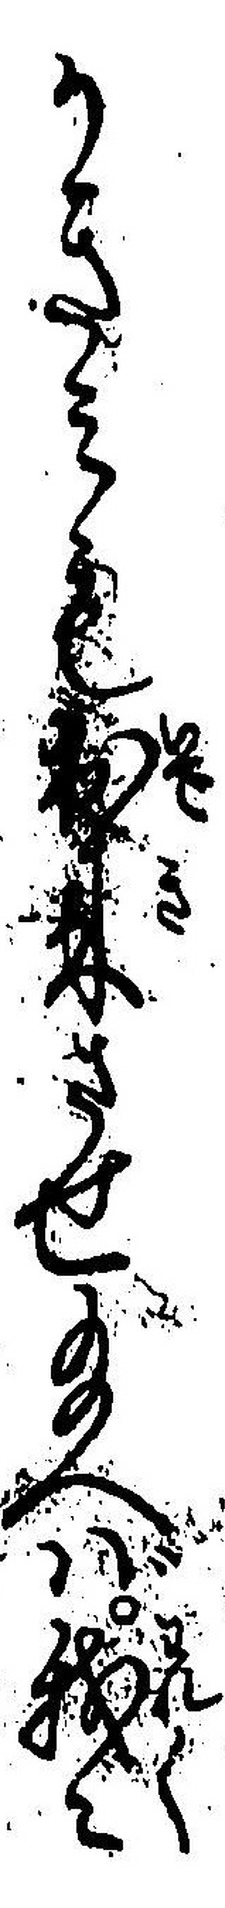かきみも出来させ給へば。我々
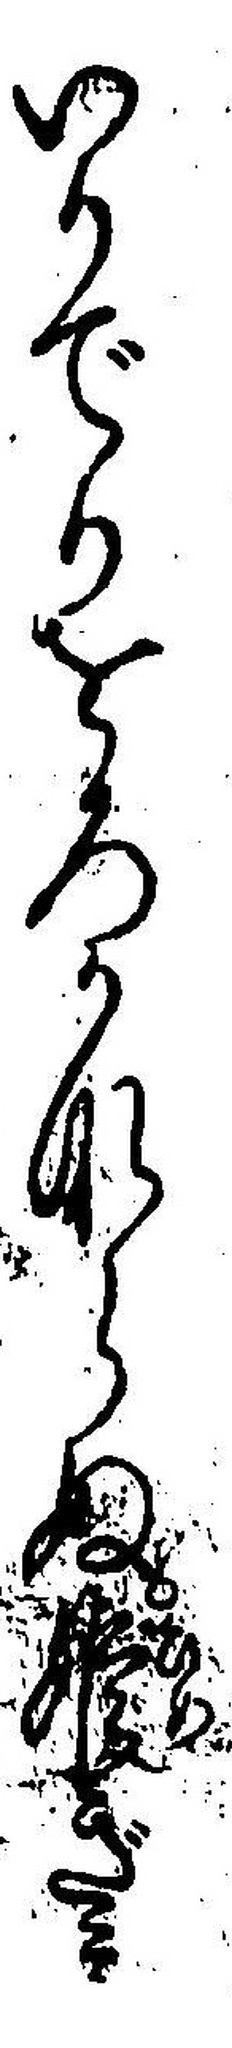いかでかをろかならぬ。姫ぎみ
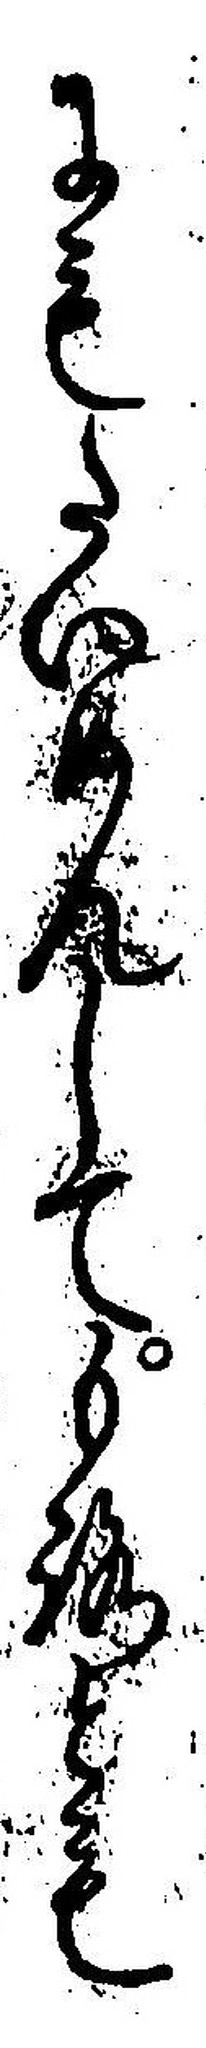にもたいめんして。もろとも

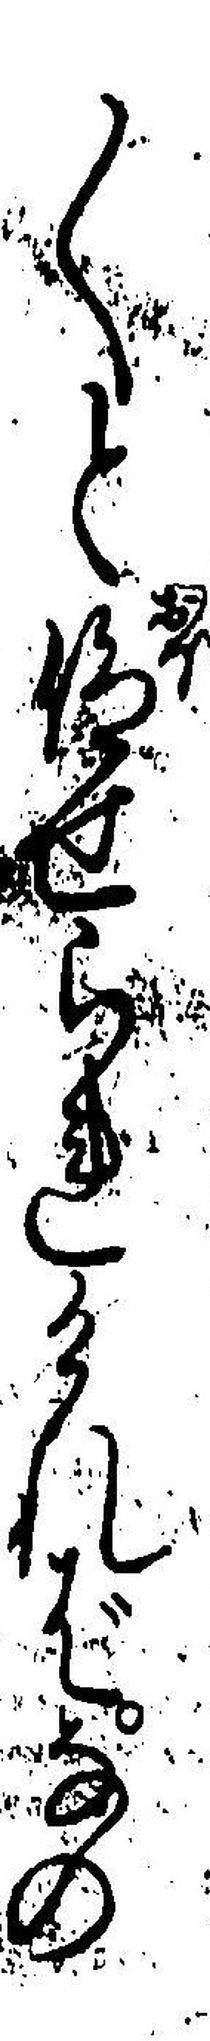〳〵と仰せられければ。なの
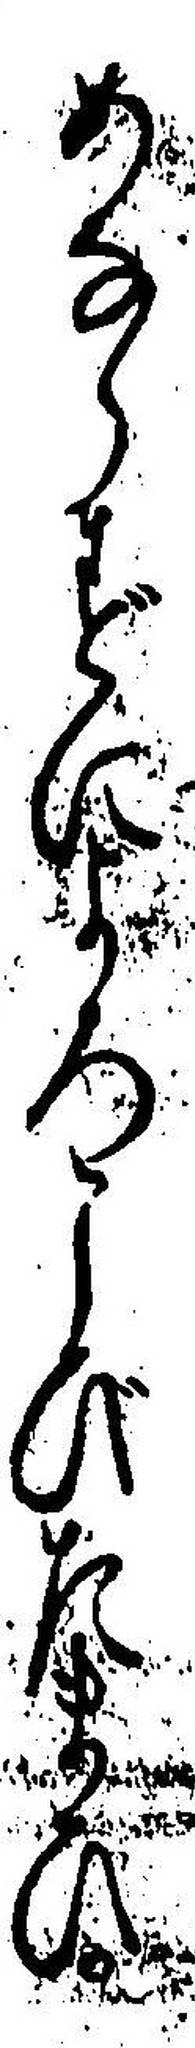めならずによろこびたまひ。
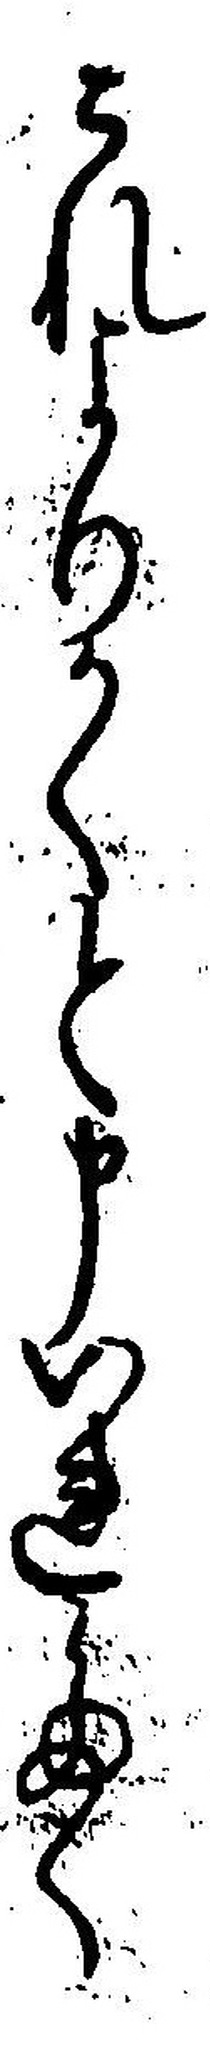これよりかくと申いれたく
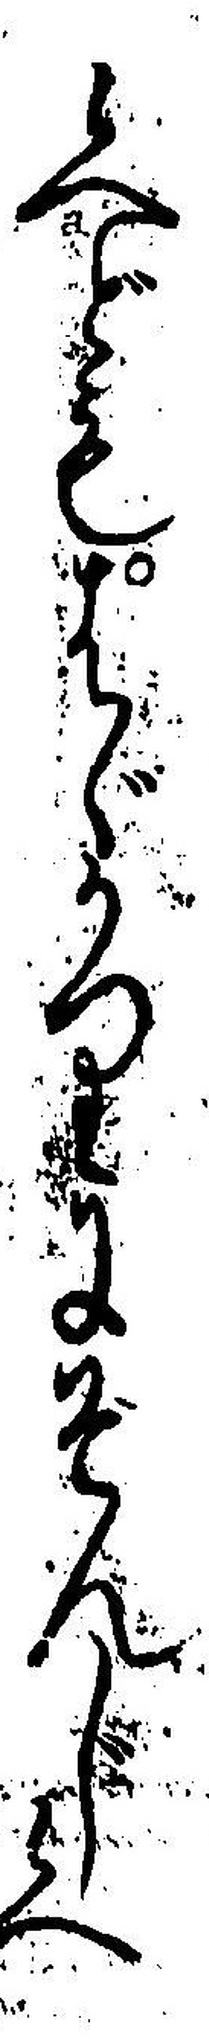候へども。はゞかりにぞんじ候へ
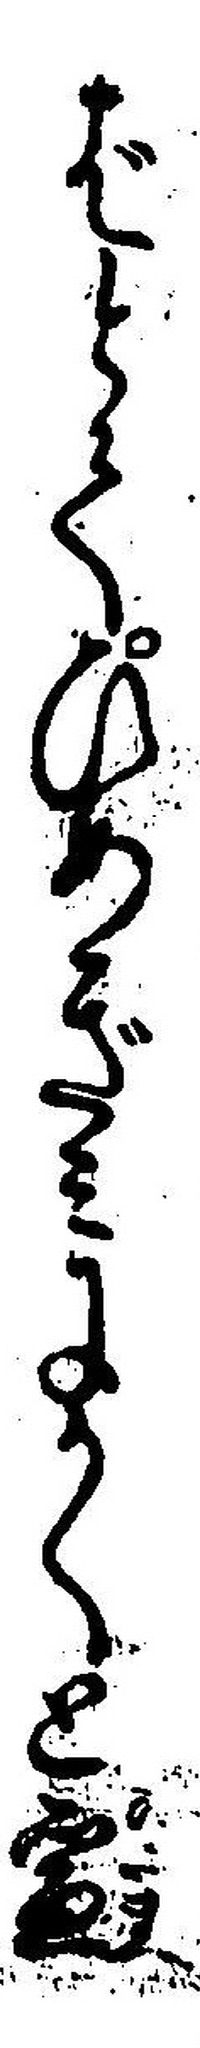ばとて。ひめぎみにかくと宣
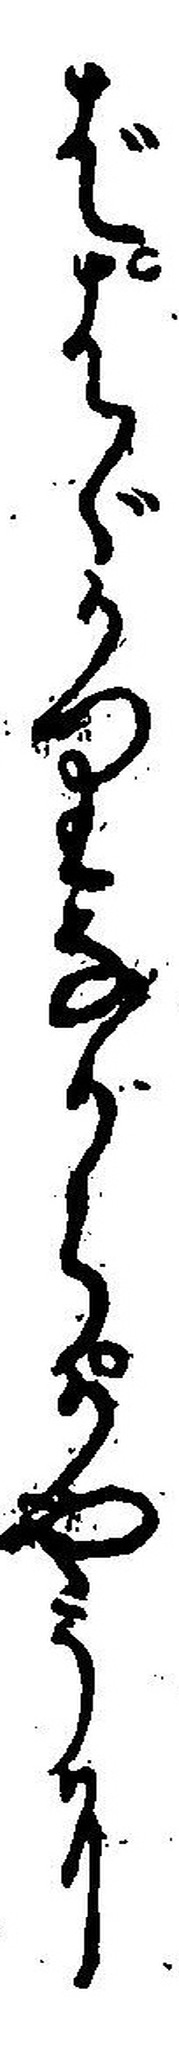ば。はゞかりながら。かやうに
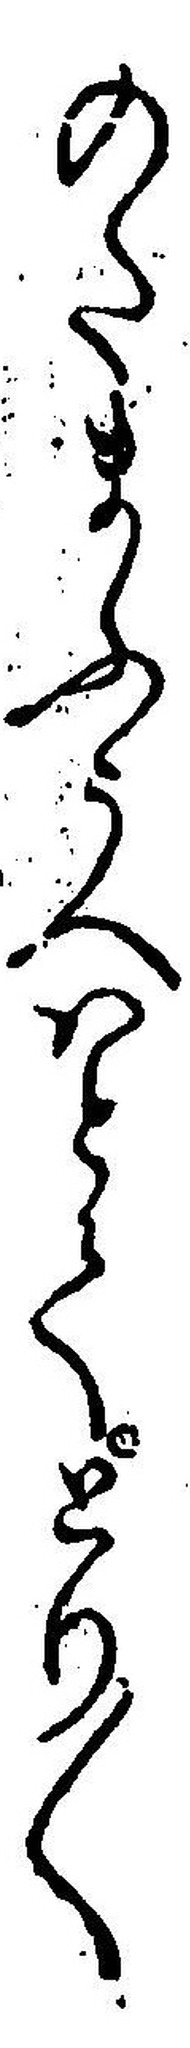のたまふうへはとて。とり〳〵
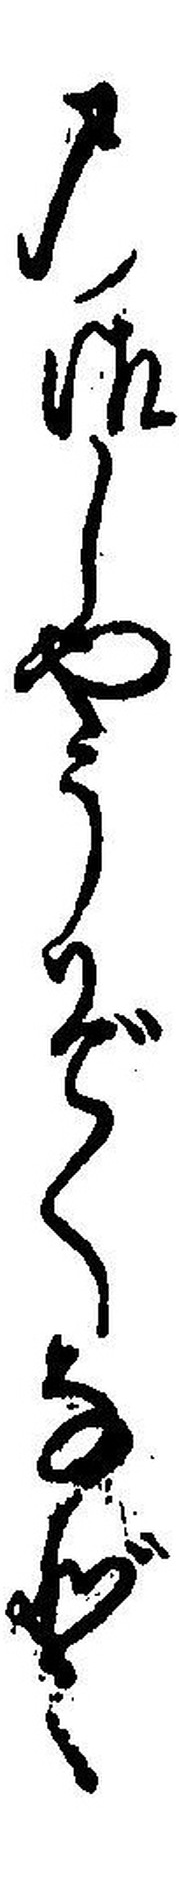の御しやうぞくなど
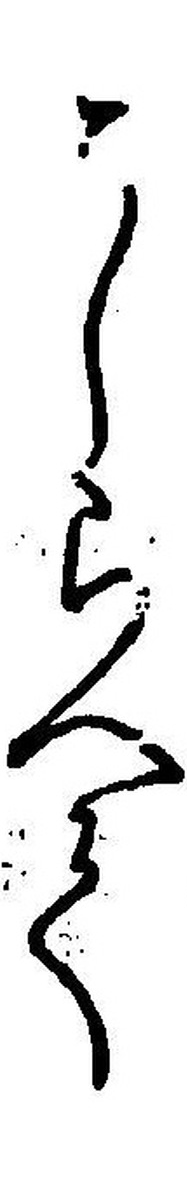こしらへて
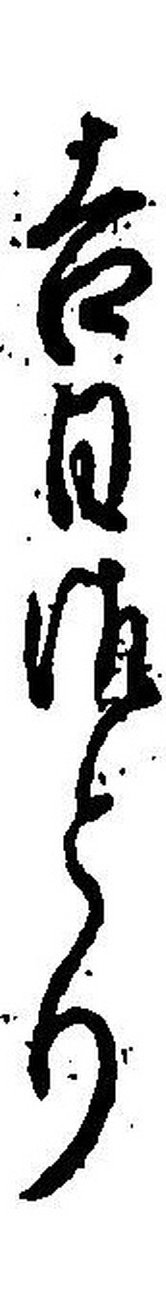吉日御とり
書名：木幡きつね
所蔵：東京大学総合図書館 General Library in the University of Tokyo, JAPAN
